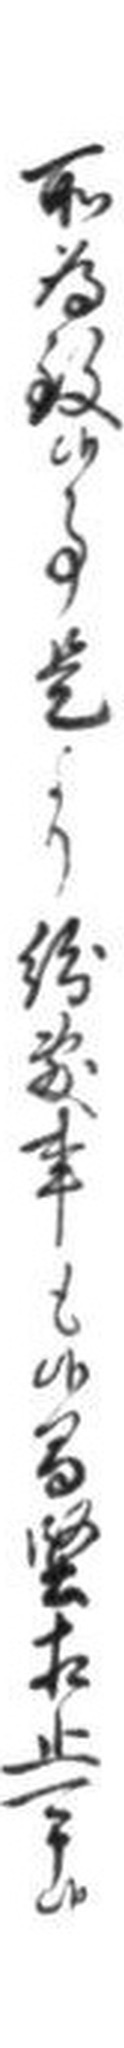所為致候事是より紛敷事も候間堅相止可申候
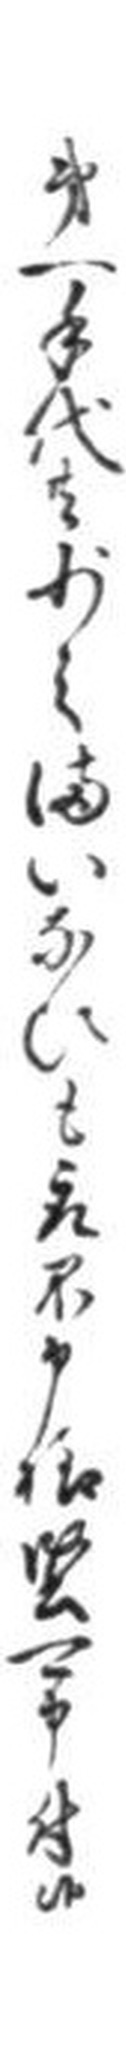第一手代共少之まいなひも取不申様堅可申付候
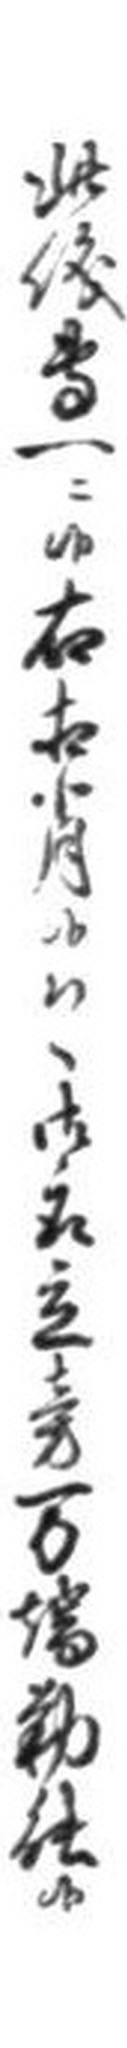此儀専一ニ候右相背候ハヽ御取立棒旁万端勤能候
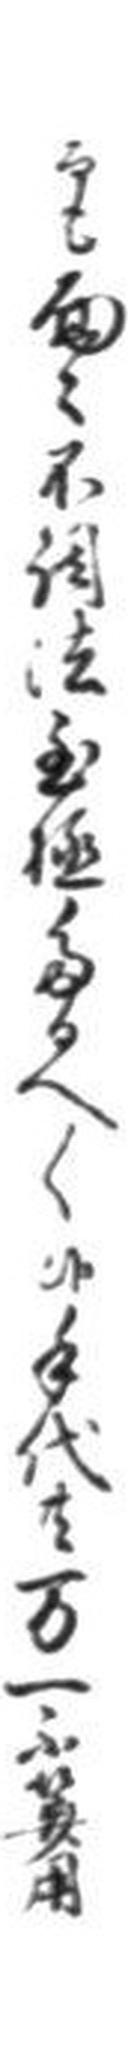而も面々不調法至極たるへく候手代共万一不算用
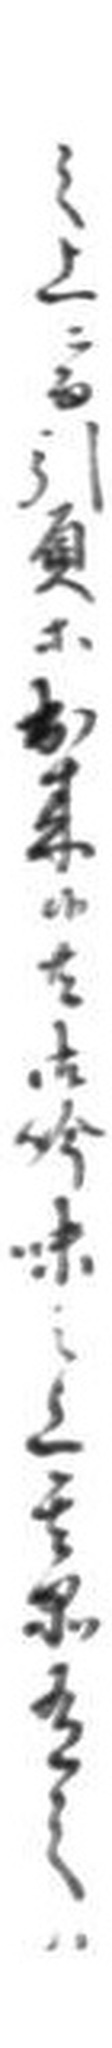之上ニ而引負等出来候共御吟味之上其品有之ハ
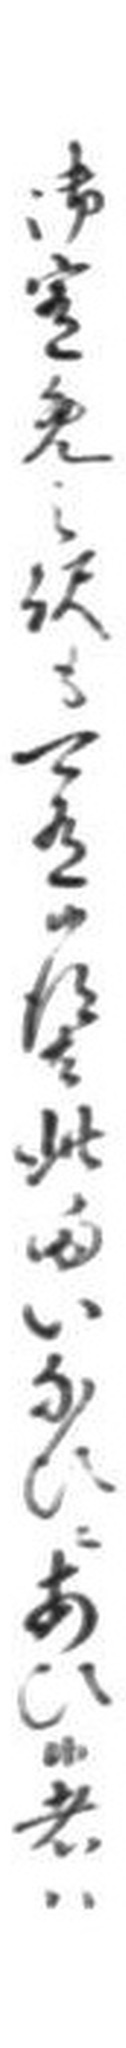御客面之訳も有之候得共此まいなひニあひ候者ハ
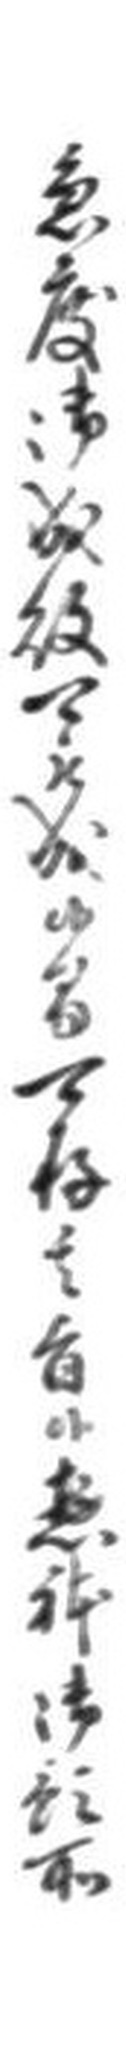急度御成敗可被成候間可存其旨候惣躰御領所
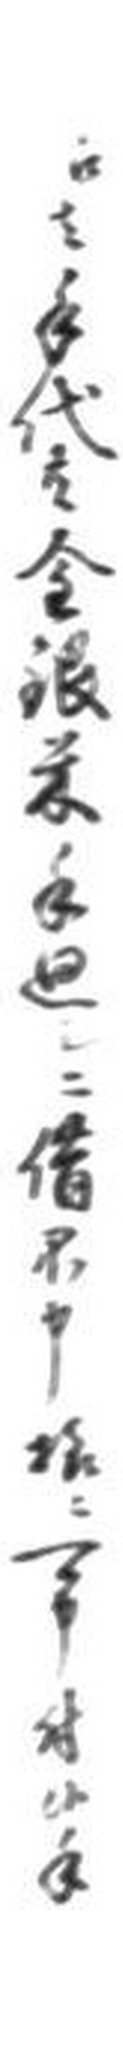江者手代共金銀米手廻シニ借不申様ニ可申付候手
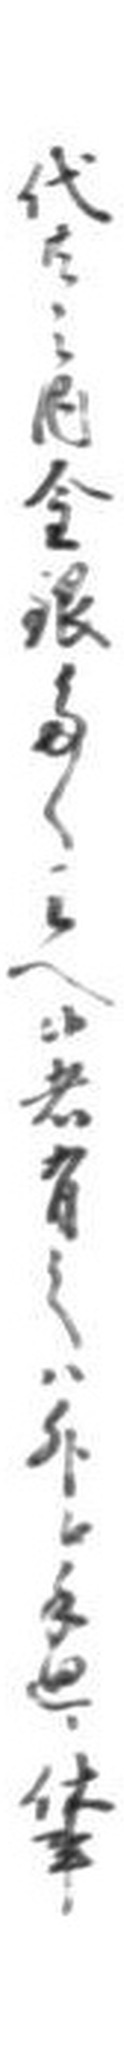代共之内金銀たくわへ候者有之ハ外江手廻り仕事
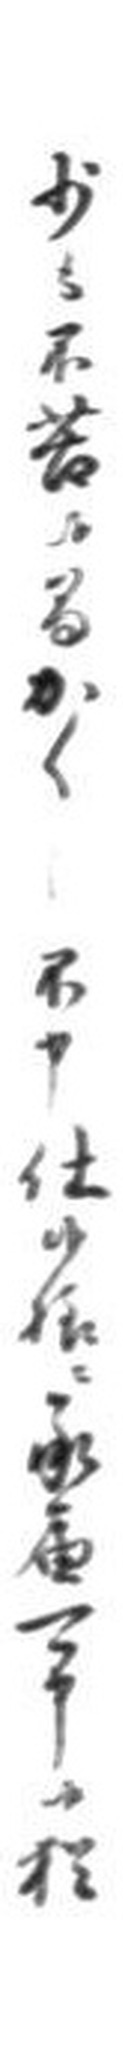少も不苦候間かくし不申仕候様ニ承届可申候猶
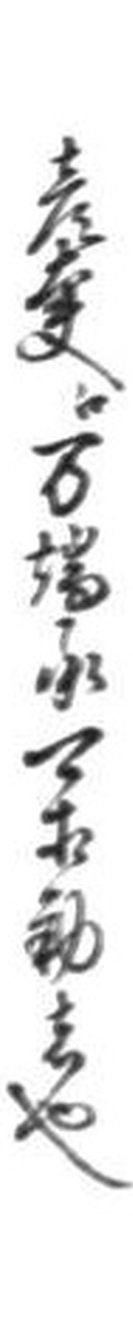彦太夫江万端承可相勤者也
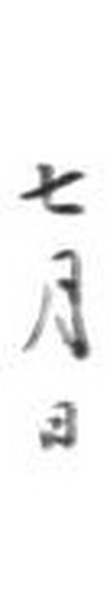七月日
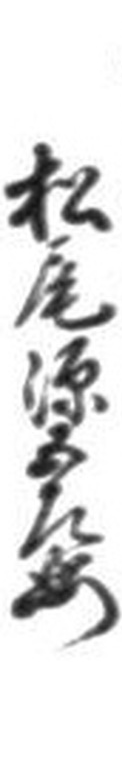松尾源五左衛門

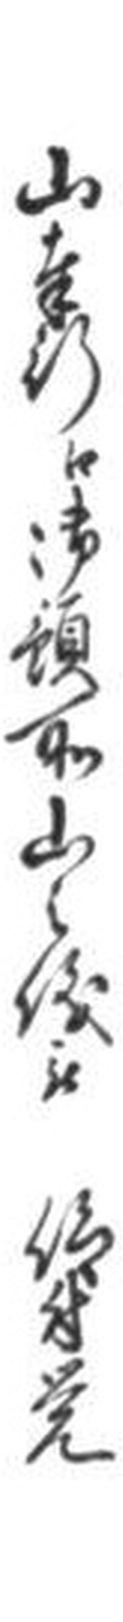山奉行江御領所山之儀被仰付覚
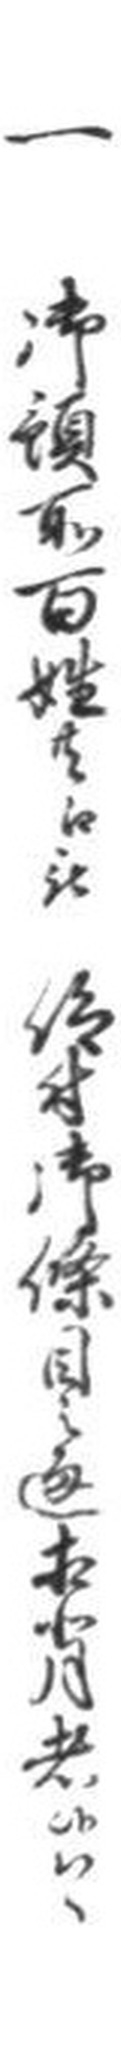一御領所百姓共江被仰付御条目之通相背者候ハヽ
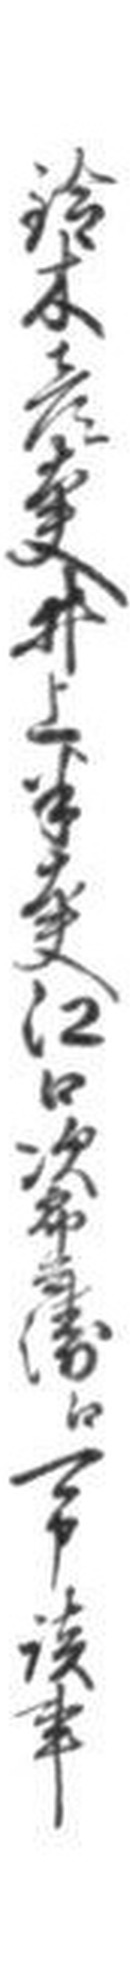鈴木彦太夫井上半太夫江口次郎兵衛江可申談事
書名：家譜 三十四 吉邦公 従享保五年到同六年
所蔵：福井県文書館 Fukui Prefectural Archives
